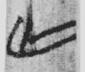亡
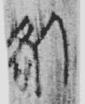咎
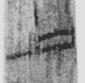上
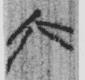六
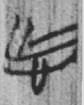忘
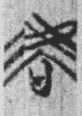○（號）
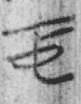𠁩
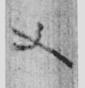又
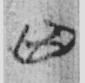凶
